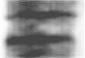二
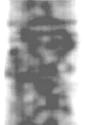○（秦）
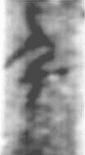弓
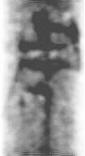用
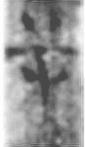矢
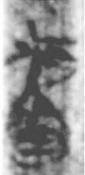○（箙）
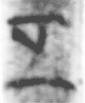五
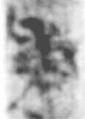秉
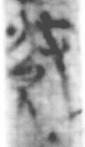○（紛）
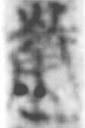○（衡）
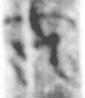戹（軛）
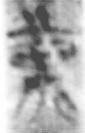黃
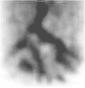金
